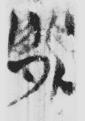{門外}
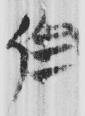於
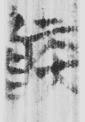疾
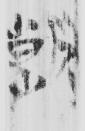朝
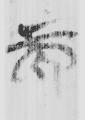而
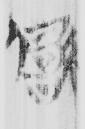{人言糸}
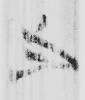之
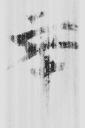不
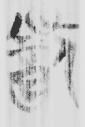猶
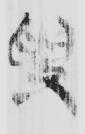受
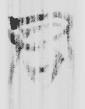君
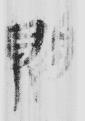賜
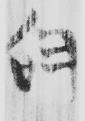吟
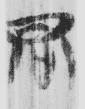君
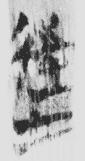{辶㞷}
